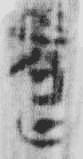者
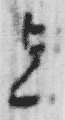也
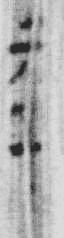亞（惡）
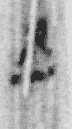之
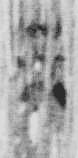而
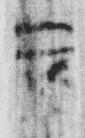不
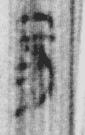可
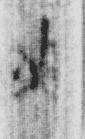非
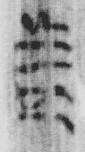者
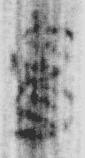○（達）
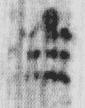於
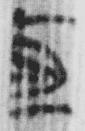宜（義）
